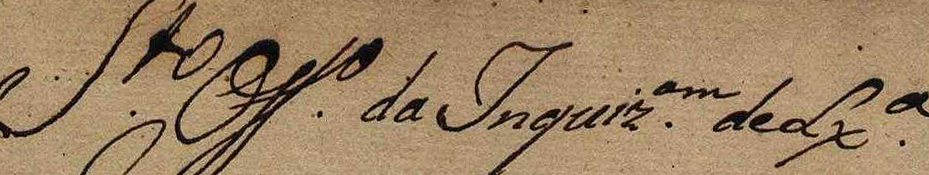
S.to Off.o da Inquiz.am de Lx.a
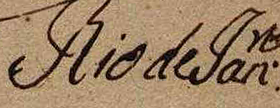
Rio de Ian.ro
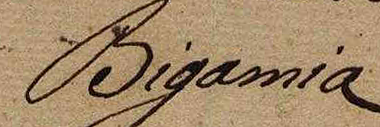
Bigamia
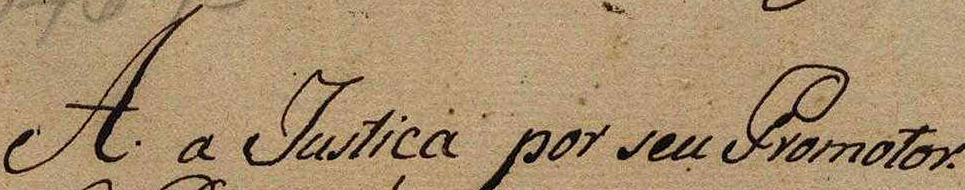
A. a Justica por seu Promotor.
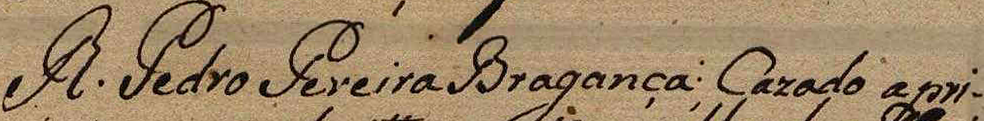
R. Pedro Pereira Bragança: Cazado a pri
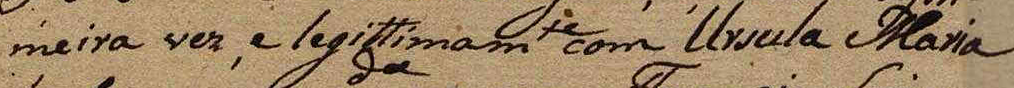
meira vez, e legittimamte com Ursula Maria
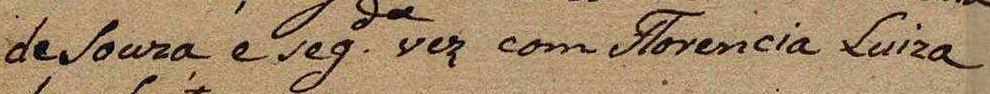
de Souza, e seg.da vez com Florencia Luiza
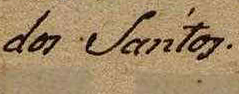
dos Santos.
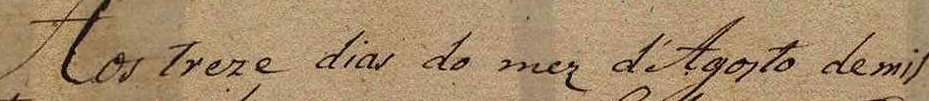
Aos treze dias do mez d'Agosto de mil
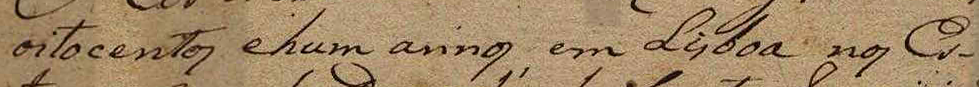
oitocentos e hum annos, em Lisboa nos Es
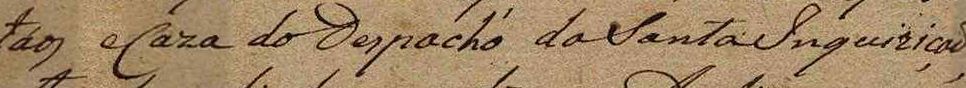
táos, e Caza do Despacho da Santa Inquiziçaõ
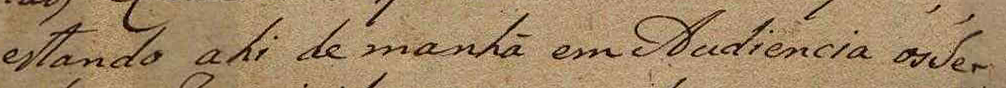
estando ahi de manhã em Audiencia os Se
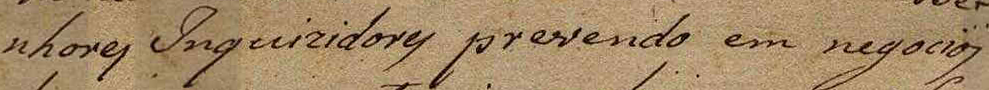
nhores Inquizidores prevendo em negocios
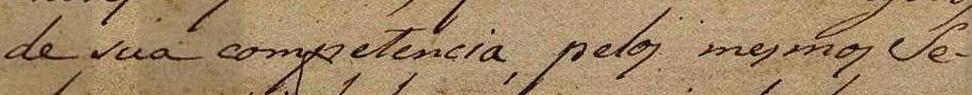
de sua competencia, pelos mesmos Se
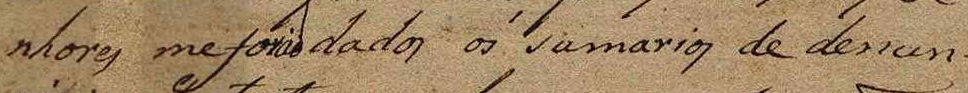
nhores me foraõ dados os sumarios de denun
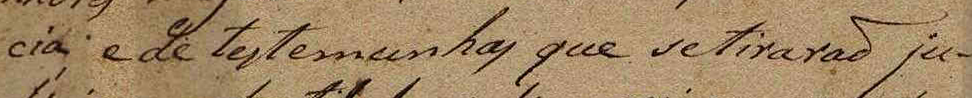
cia, e de testemunhas que se tiraraõ ju
